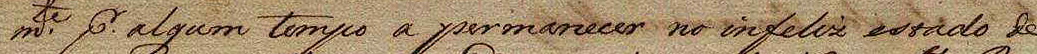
m.te p.r algum tempo a permanecer no infeliz estado de
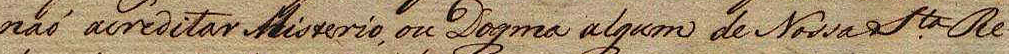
naõ acreditar Misterio, ou Dogma algum da Nossa S.ta Re
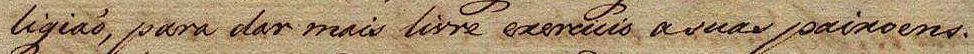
ligiaõ, para dar mais livre exercicio a suas paixoens.
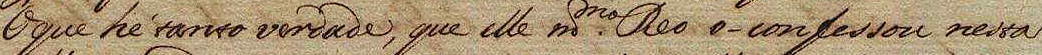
O que hé tanto verdade, que elle m.mo Reo o-confessou nesta
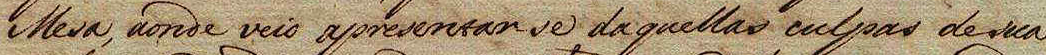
Mesa, aonde veio apresentar-se daquellas culpas de sua
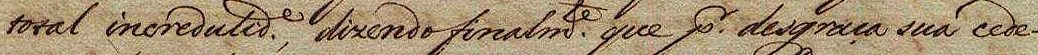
total incredulid.e, dizendo finalm.te que p.a desgraça sua cede
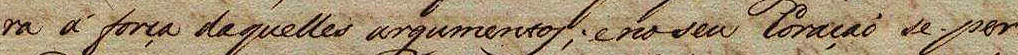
ra á força daquelles argumentos; e no seu Coraçaõ se-per
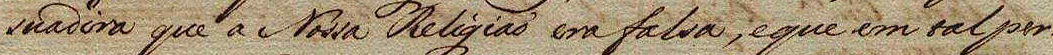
suadira que a Nossa Religiaõ era falsa, e que em tal per
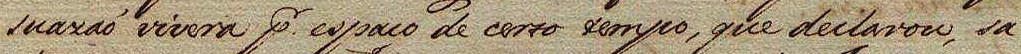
suazaõ vivera p.r espaço de certo tempo, que declarou, sa
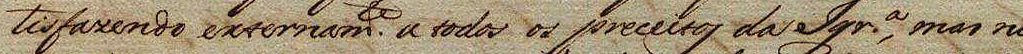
tisfazendo externam.te a todos os preceitos da Igr.a, mas no
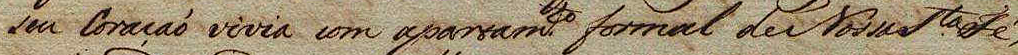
seu Coraçaõ vivia com apartam.to formal de Nossa S.ta Fé,
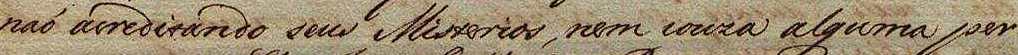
naõ acreditando seus Misterios, nem couza alguma per
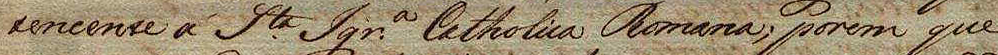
tencente a S.ta Igr.a Catholica Romana; porem que
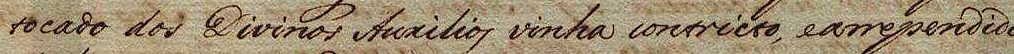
tocado dos Divinos Auxilios vinha contricto, e arrependido
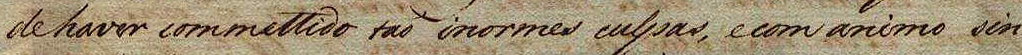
de haver commettido taõ inormes culpas, e com animo sin
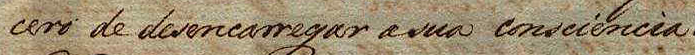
cero de desencarregar a sua consciencia.
